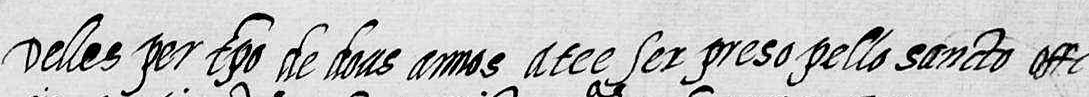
Delles per tp̄o de dous annos atee ser preso pello sancto offi
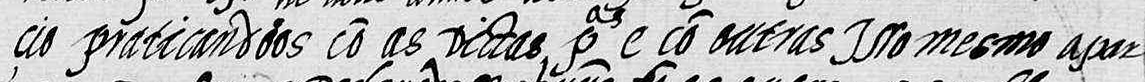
cio praticandoos cō as Dictas pas e cō outras Jsso mesmo apar
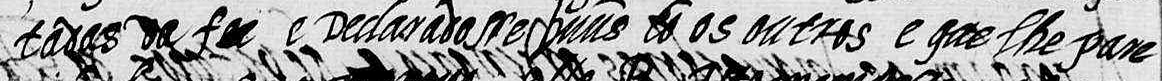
tadas da fee e Declarādosse hu̅us cō os outros e que lhe pare
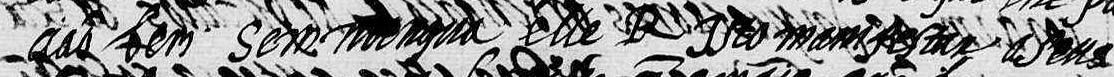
ciaõ bem sem nunqua elle R Jsto manifestar a seus
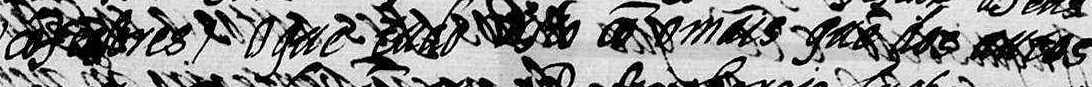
cōfessores / O que tudo veo c̄o o mais que dos autos
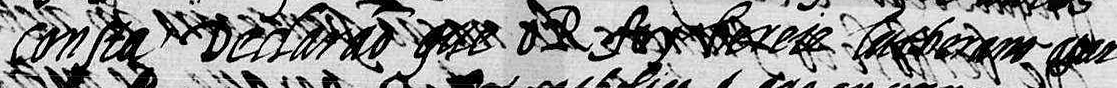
consta Declaraõ que o R. foy hereie lutherano apar
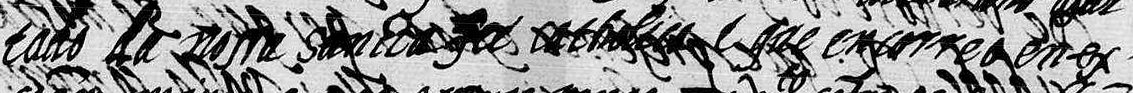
tado da nossa sancta fee catholica e que encorreo en ex
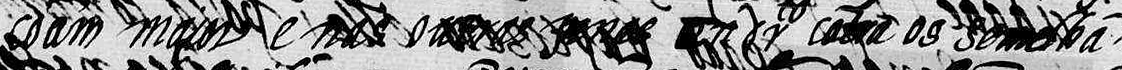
coām maior e nas outras penas en drto cōtra os semelhā
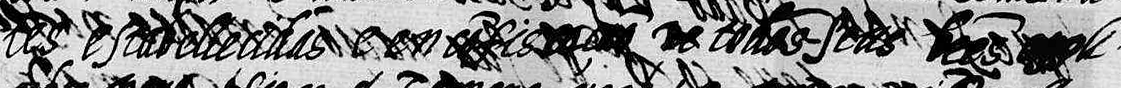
tes estabellecidas e en cōfiscaçaõ de todos seus beēs appli
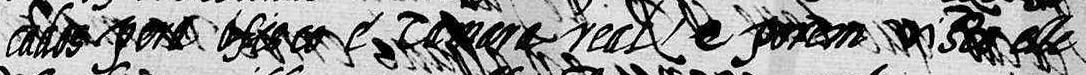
cados pera o fisco e camara real e porem visto elle
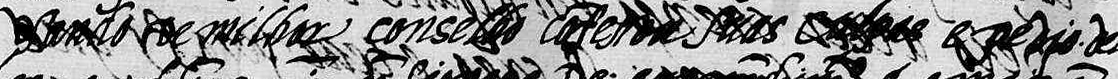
vsando de milhor conselho cōfessou suas culpas e pedio de
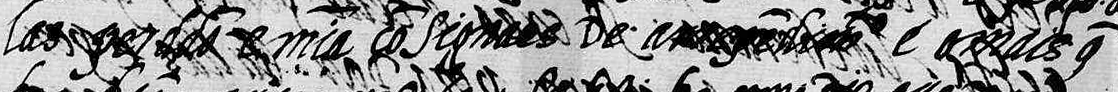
las perdaõ e mīa cō signaes De arrepēdimto e o mais q̄
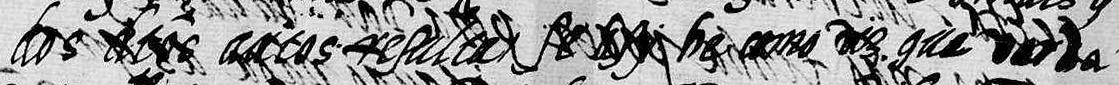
dos dtōs autos resultar se asy he como diz que verda
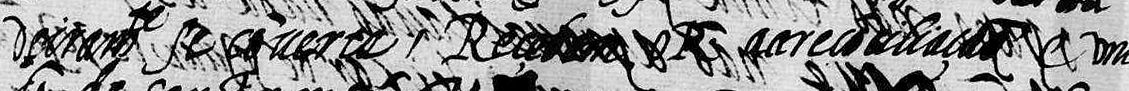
deiramte se cōuerte Recebem o R. aa recōciliaçaõ e vni
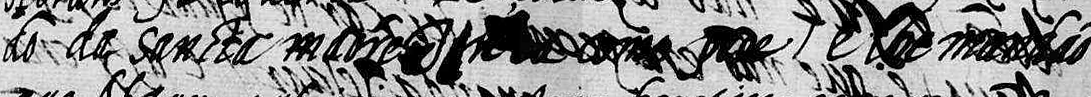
aõ da sancta madre Jgreia como pede / e lhe mandaõ
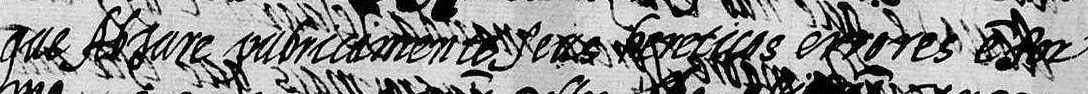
que Abjure pubricamente seus hereticos errores ē for
